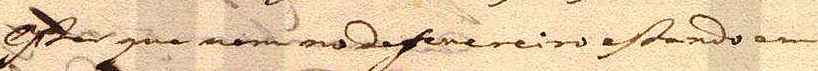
Ester que uem no de feuereiro estando em
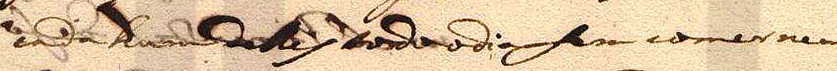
cada hum delles todo o dia sem comer nem
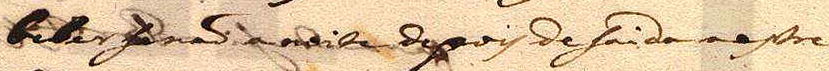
beber senão a noite depois de saida a estre
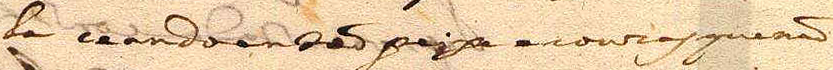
la ceando então peixe e couzas que não
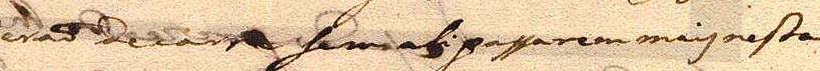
eraõ de carne sem ali passarem mais nesta
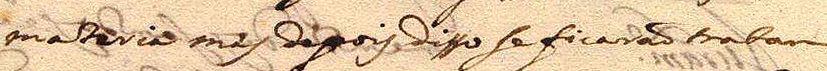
materia mas depois disso se ficarão tratan
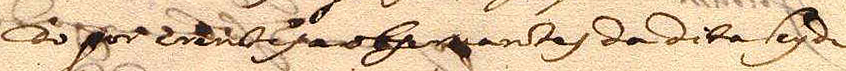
do por crentes e obseruantes da dita ley de
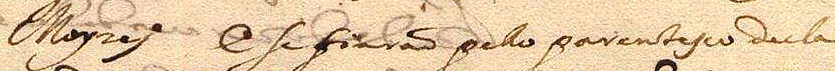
Moyzes E se fiarão pello parentesco decla
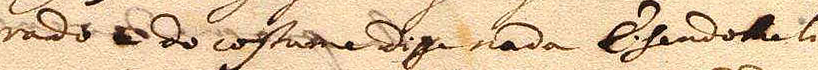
rado _ do costume disse nada E sendolhe li
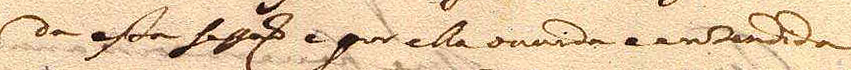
da esta sessaõ e por ella ouuida e entendida
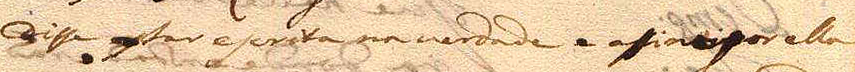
disse estar escrita na uerdade e assinei por ella
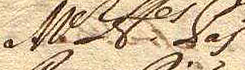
Mel Hes. Paj
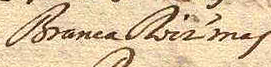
Branca Roiz̄ maj
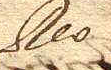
Reo
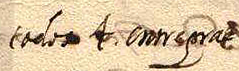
todos 4. entre prat
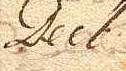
Decl
